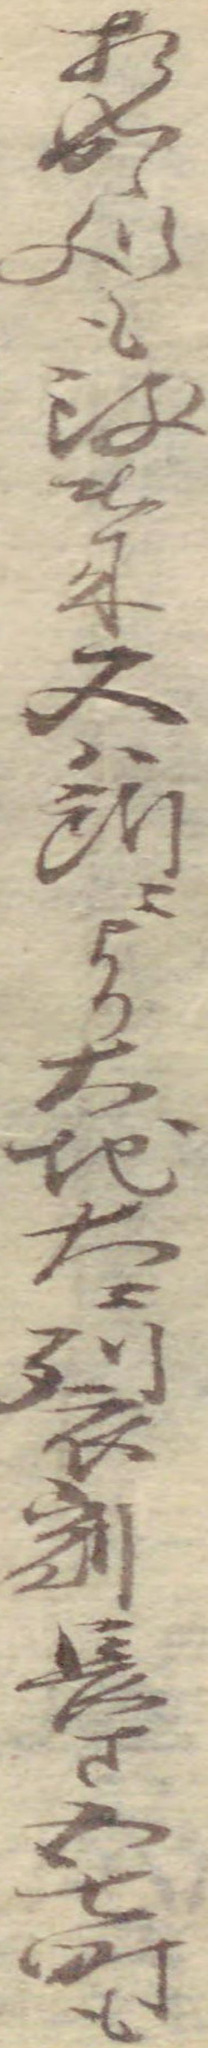相成候処も致出来又ハ所ニより大地大ニ裂割長さ五七町も
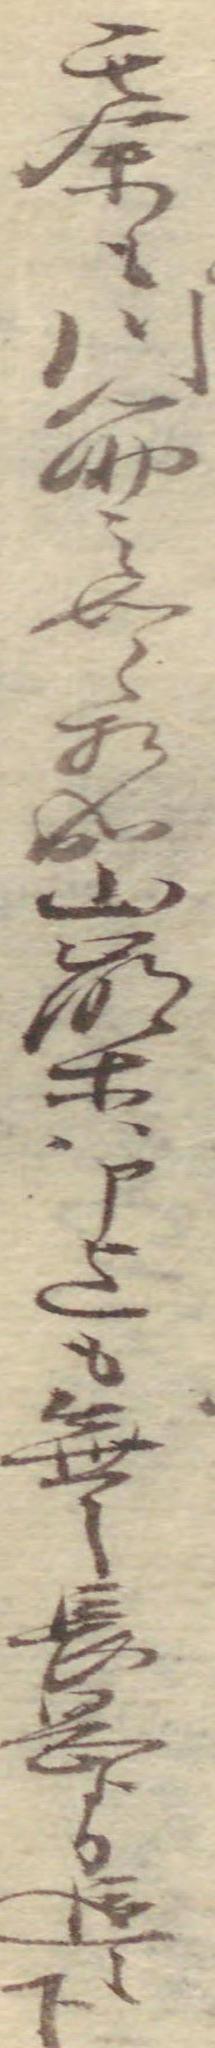其余も川筋之如く相成山崩等ハ申迄も無之長岡より追〻下
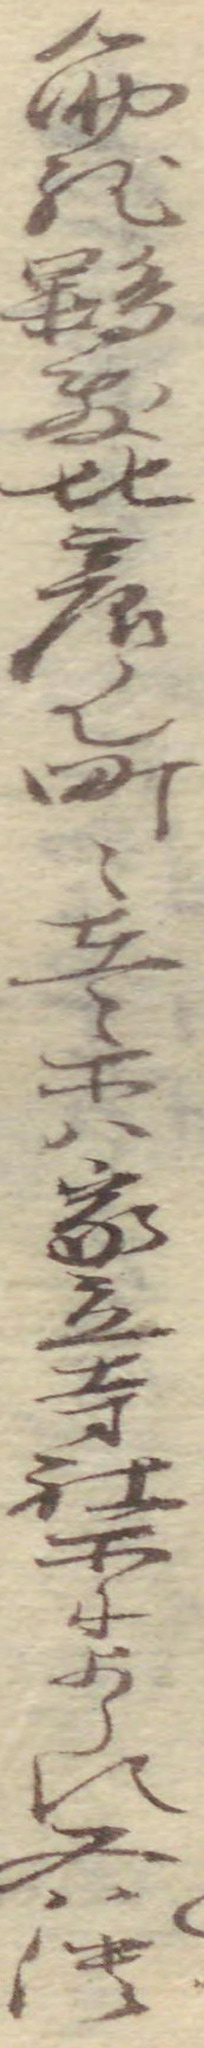筋程夥敷地震ニて町〻在〻所ハ家立寺社所によらす又ハ潰
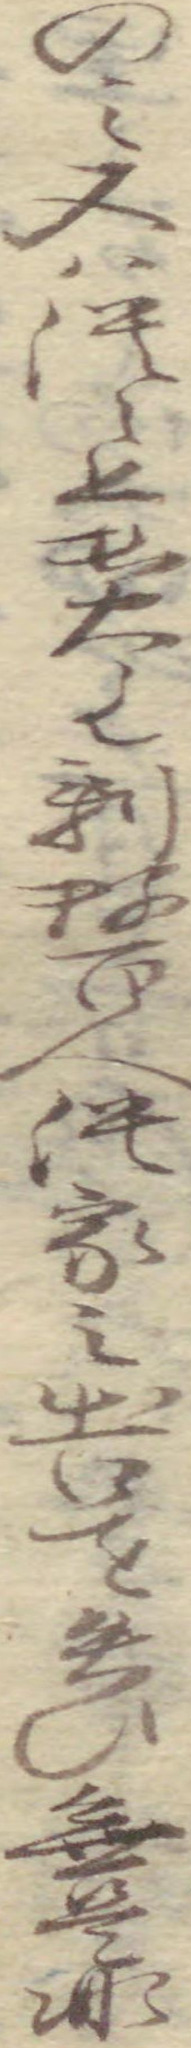のミ又ハ潰之上出火ニて剰数百人潰家之出口を失ひ無是非
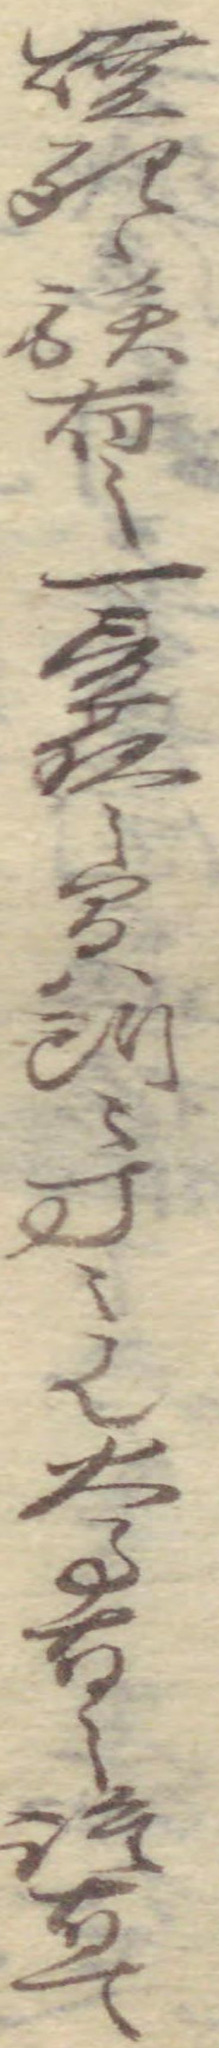焼死之族有之一昼夜之間ハ所〻方〻ニて火事有之誰有て
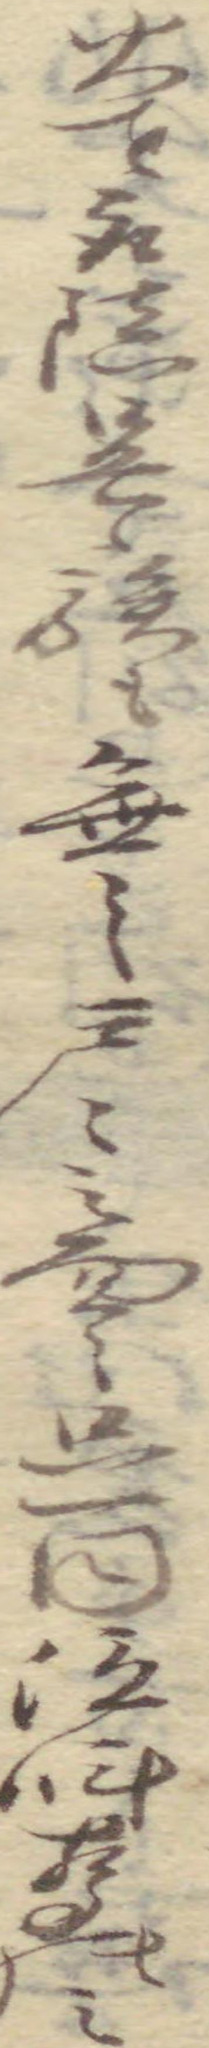火を取鎮呉候族も無之戸〻之面〻只一同泣叫声のミ
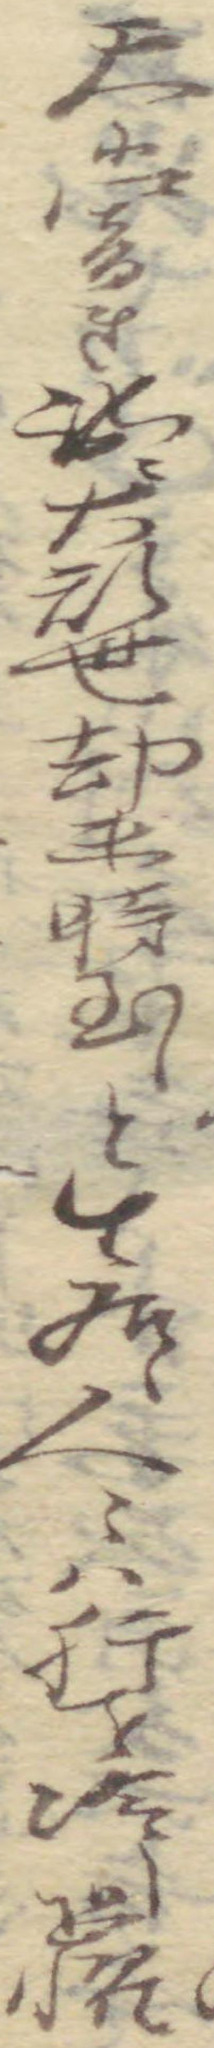天に響き誠ニ大乱世却来時至候と生居候人〻ハ肝を冷し恐惶
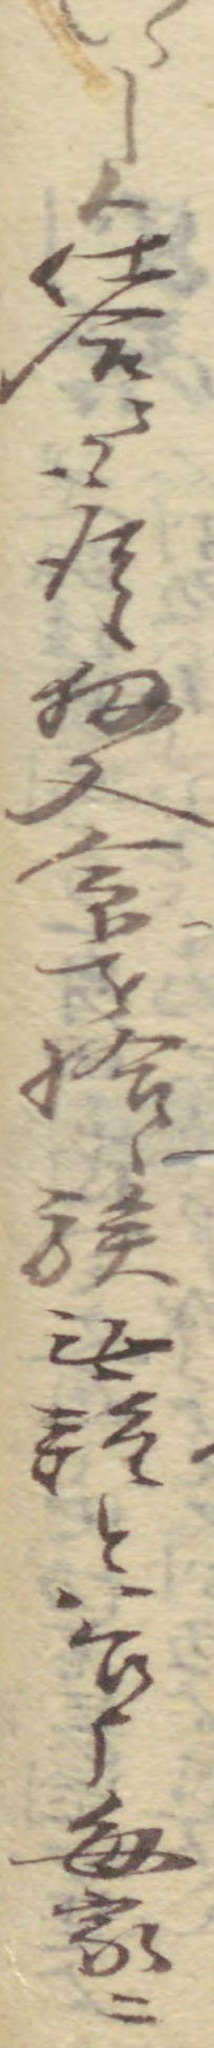いたし候仕合ニ御座候扨又命を拾候族無難とハ乍申毎家ニ
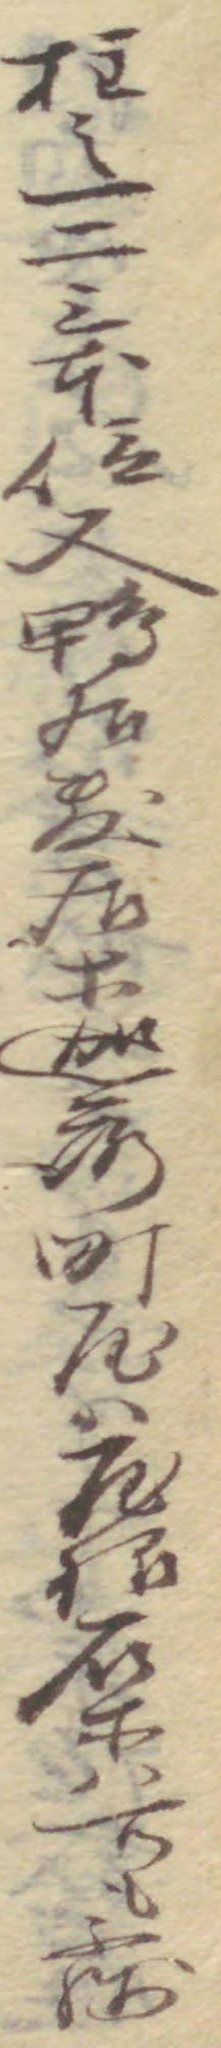柱之一二三本位又鴨居敷居等迦落町家ハ屋根石等ハ一ツも不残
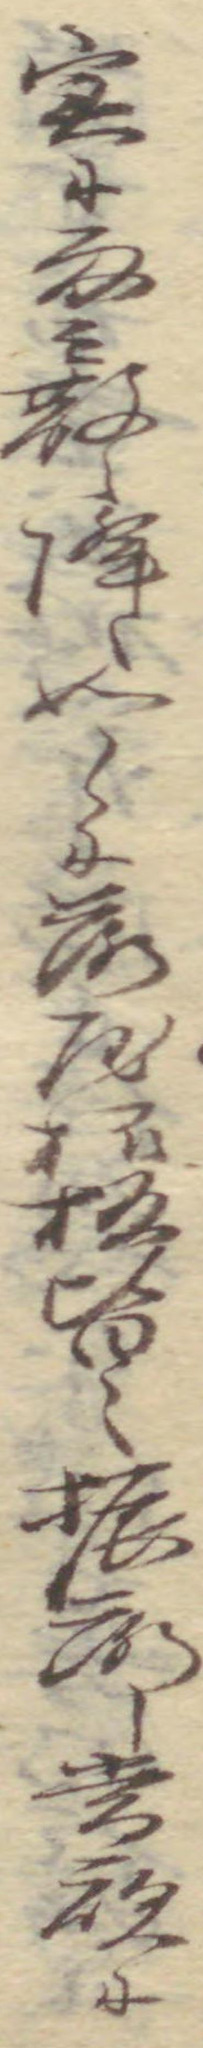実に雨を散〻降候如くに落屋根板皆〻振落候当夜に
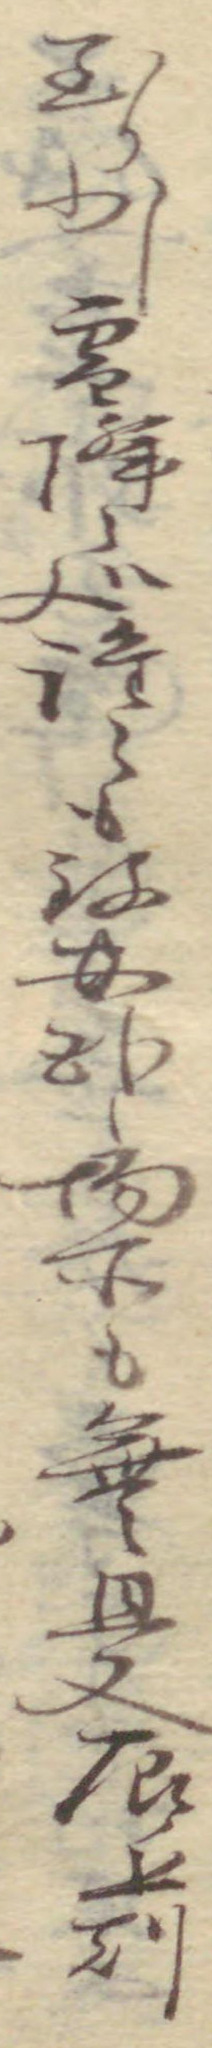至り少し雪降候処誰ニも致安眠候場所も無之且又辰上刻
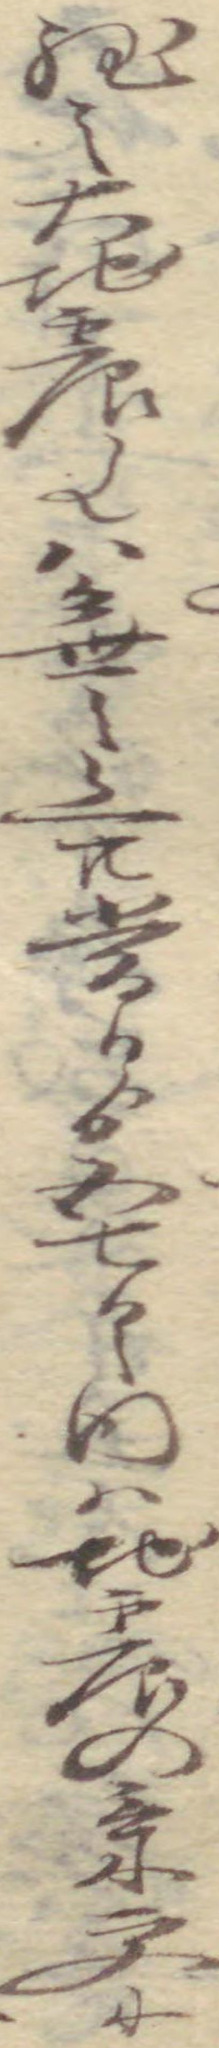程之大地震ニてハ無之候へ共当日ゟ五七日之内ハ地震の気更に
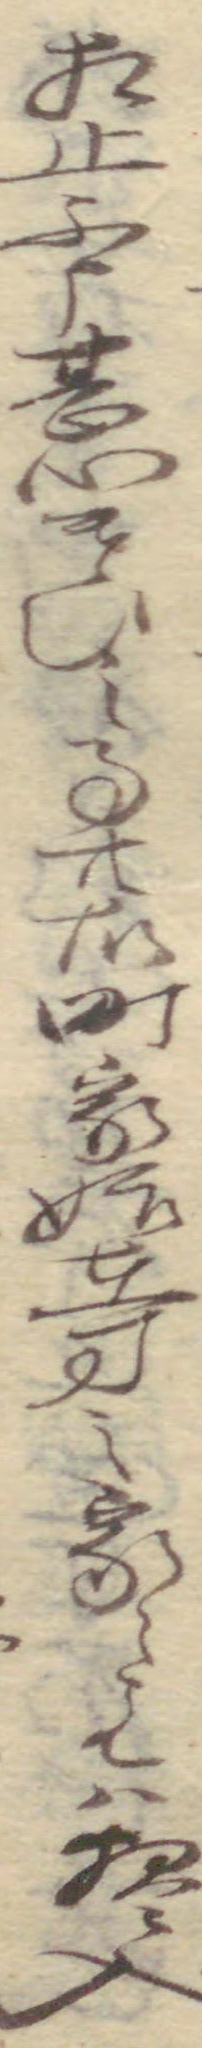相止不申甚心遣ひ之事共故町屋始在方之家〻ニてハ夜ニ入
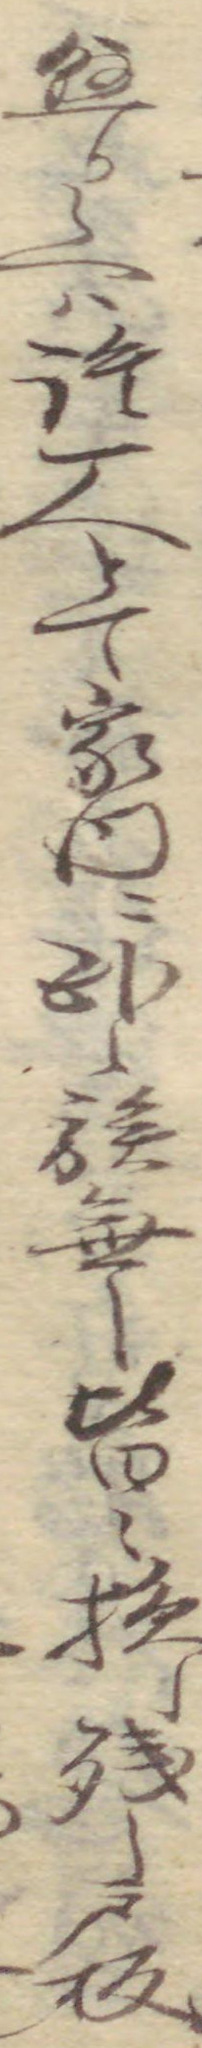懸り候へハ誰一人とて家内ニ眠候族無之皆〻損候残之戸板
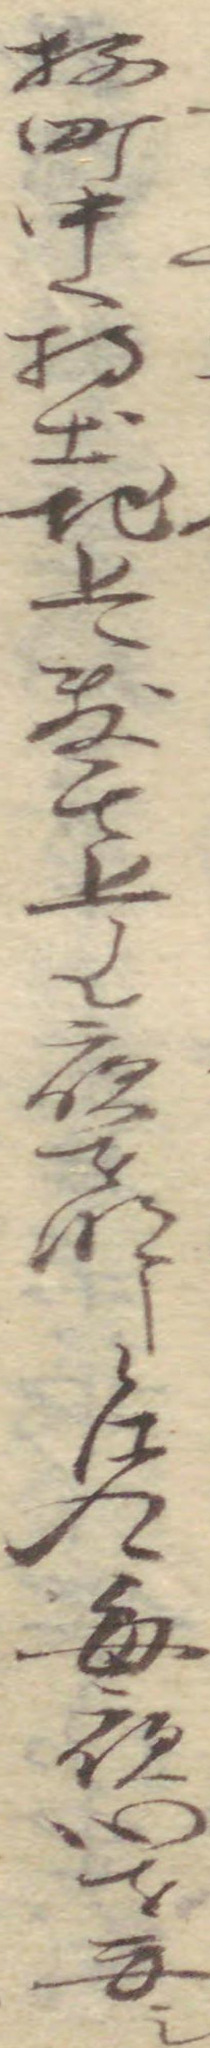抔町中へ持出地上へ敷其上ニて夜を明し候仕合毎夜心を安シ
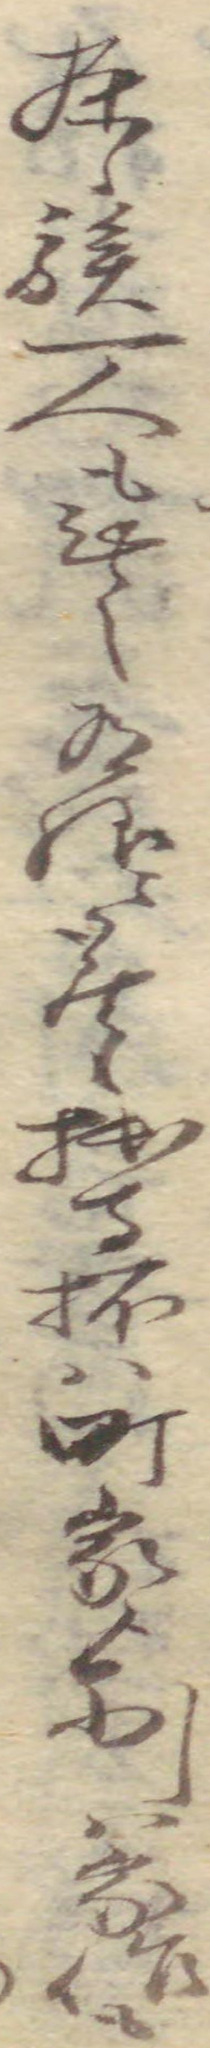寝る族一人も無之有様ニ御座候拙寺抔ハ町家ゟ少しハ家作も
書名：鶯宿雑記. 巻199-200
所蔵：国立国会図書館 National Diet Library, JAPAN
